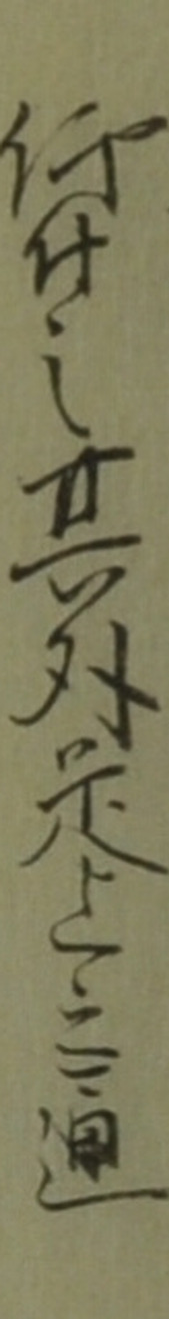仰付之其外是迄之通

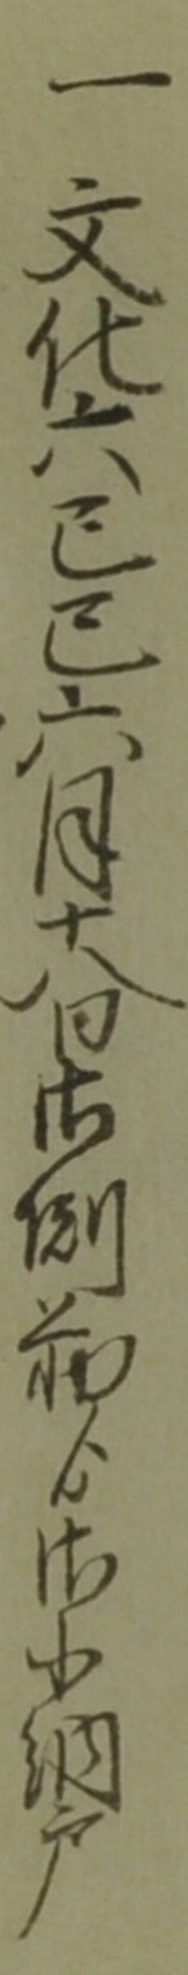一文化六己巳六月十八日御側勤ゟ御小納戸
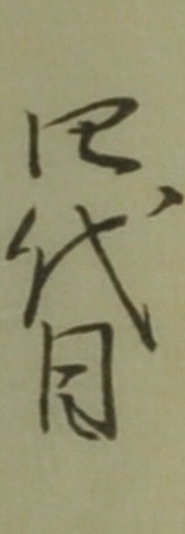四代目
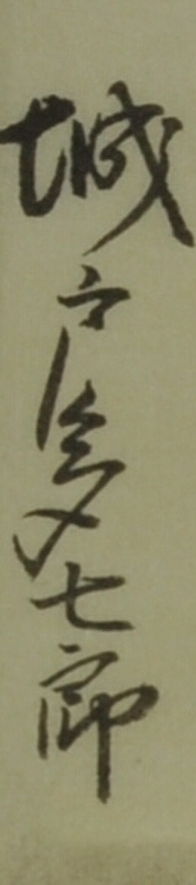城戸多七郎
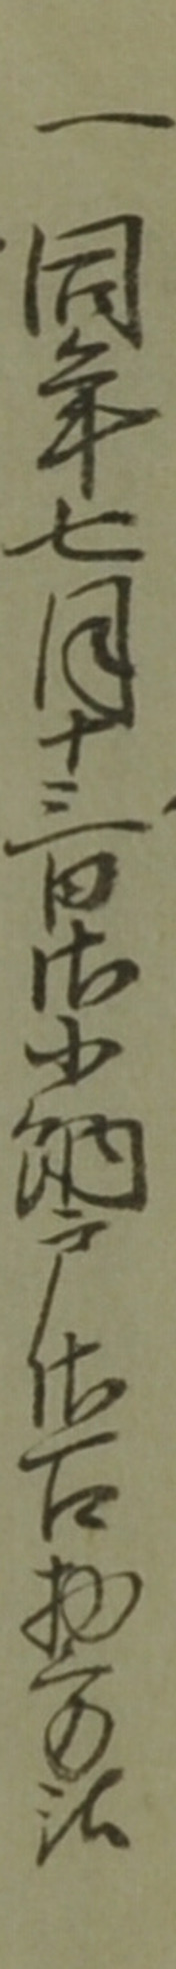一同年七月十三日御小納戸御召物方被
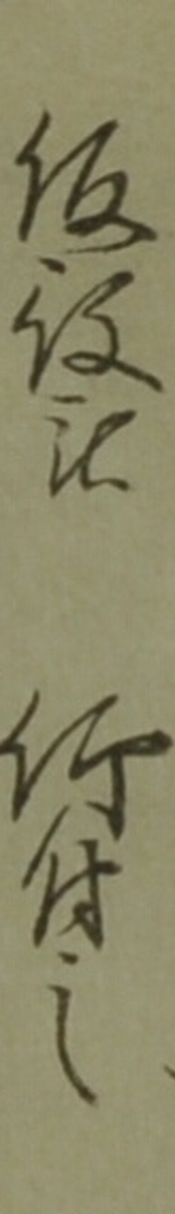仮役被仰付之
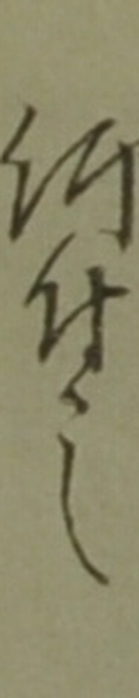仰付之
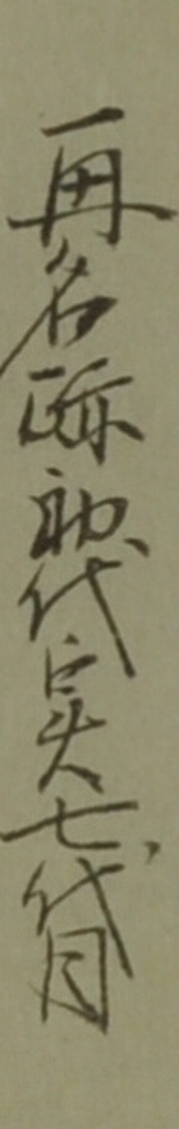再名跡初代実七代目
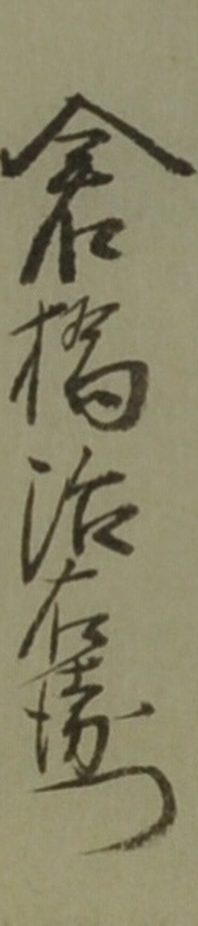倉橋治右衛門
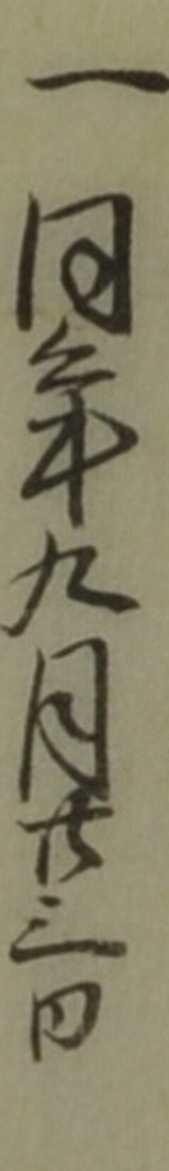一同年九月廿三日
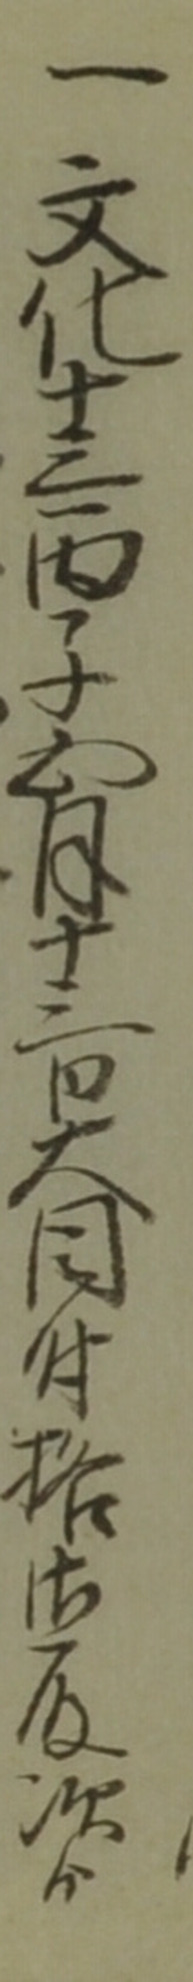一文化十三丙子五月十三日大目付格御取次
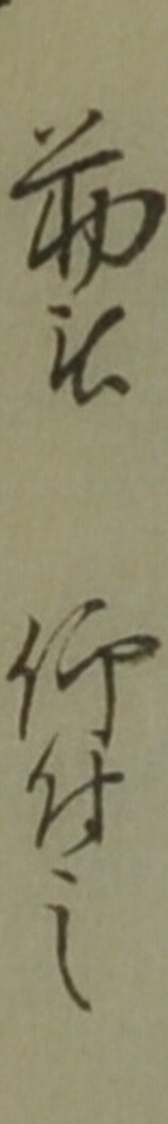勤被仰付之
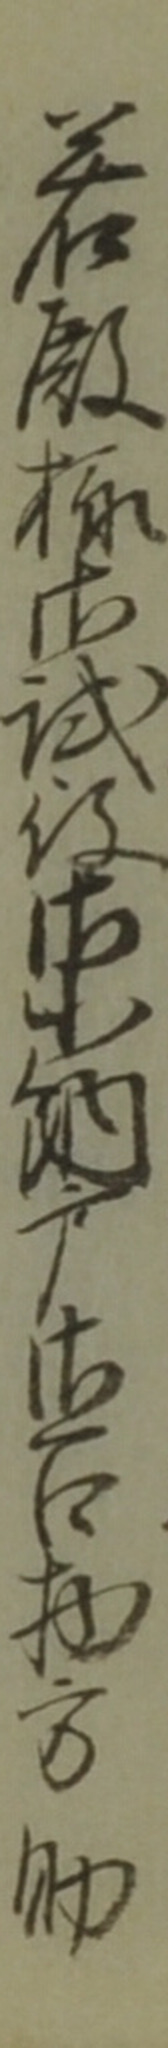若殿様御試役御小納戸御召物方助
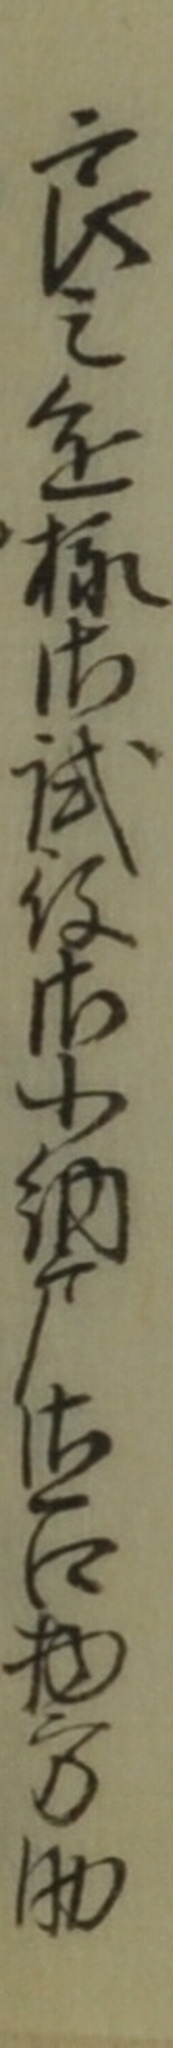良之進様御試役御小納戸御召物方助
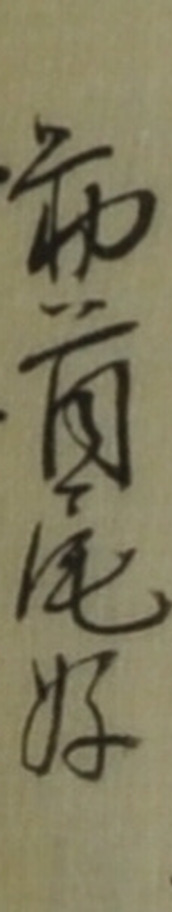勤首尾好
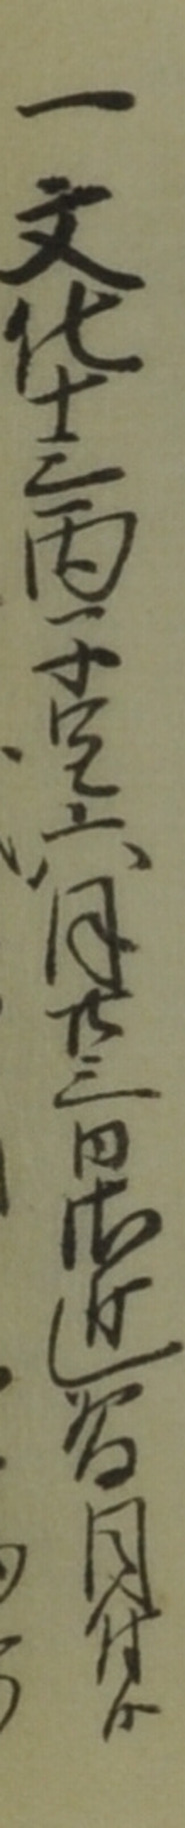一文化十三丙子閏六月廿三日御近習目付ゟ
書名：諸御役代々録（四）
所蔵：伊那市立高遠町図書館・合同会社AMANE
